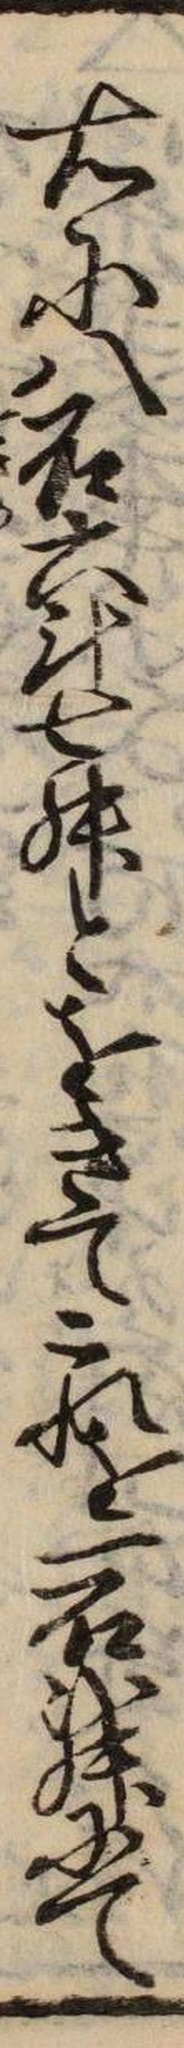右に八石六斗七舛とをきてこれを一石弐舛にて
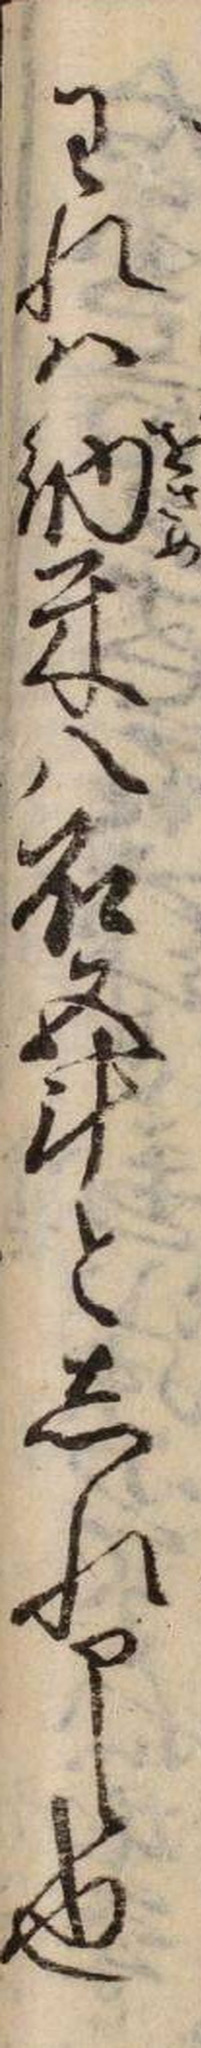われは納米八石五斗としれ申候也
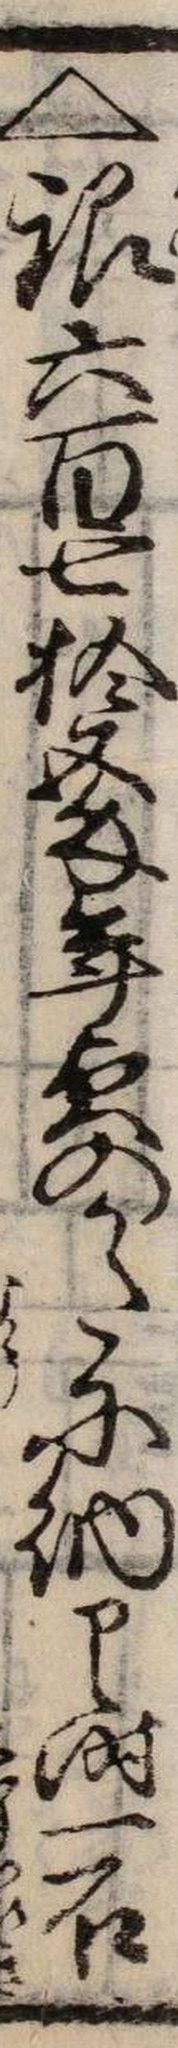△銀六百七拾五匁年具のかたに納申候時一石
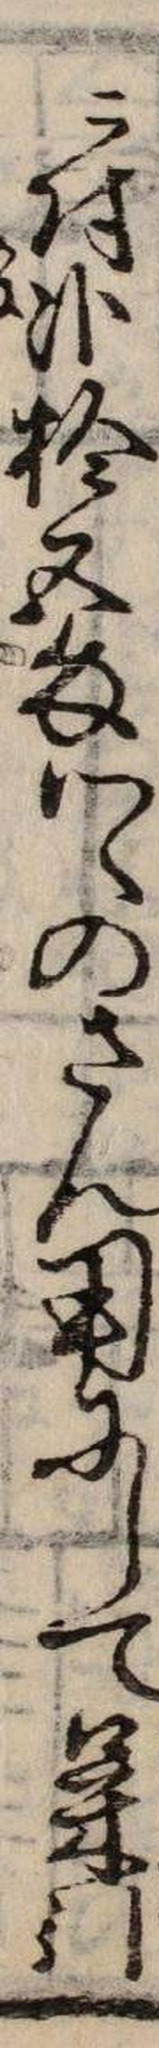に付弐拾五匁つゝのさん用にして口米引
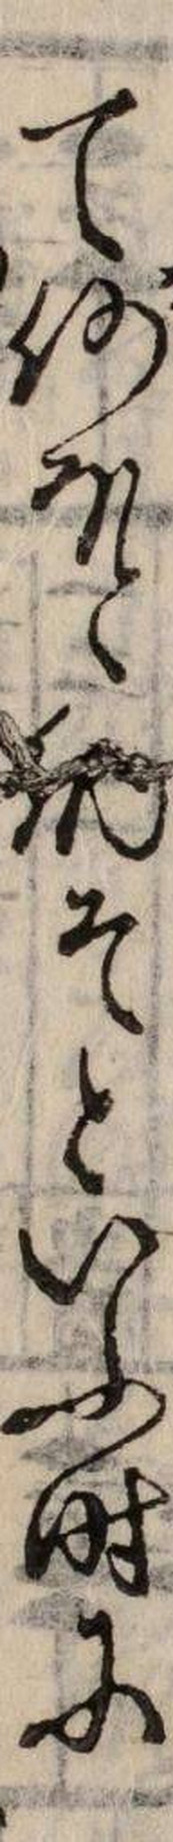て何ほと納そといふ時に
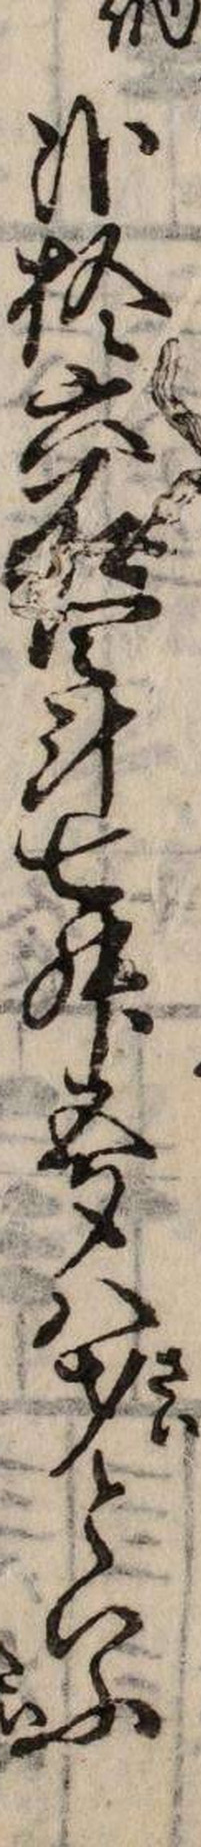納弐拾六石四斗七舛五夕八才といふ
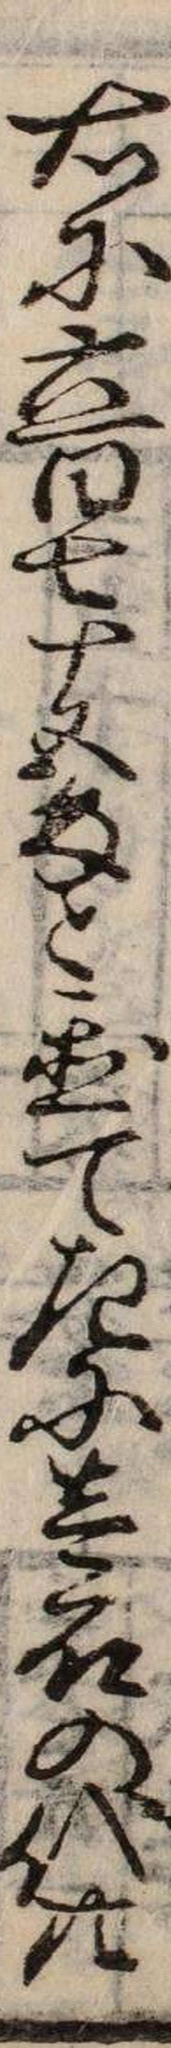右に六百七十五匁と置て左に壱石の代廿
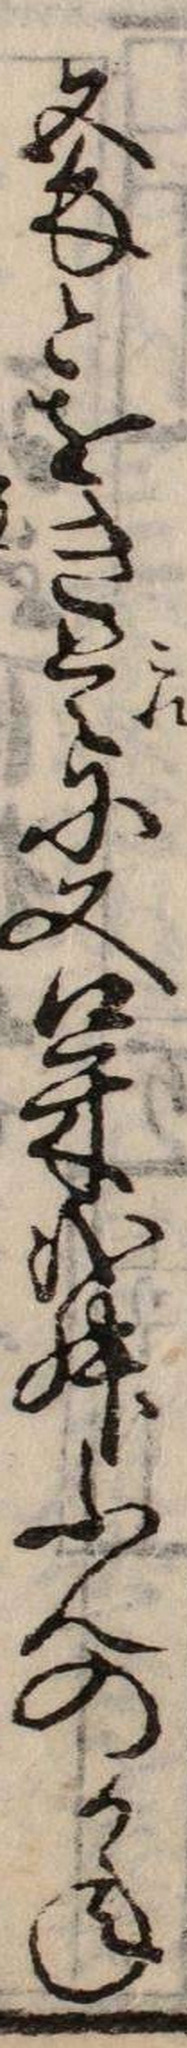五匁とをき是に又口米弐舛ふんのかね
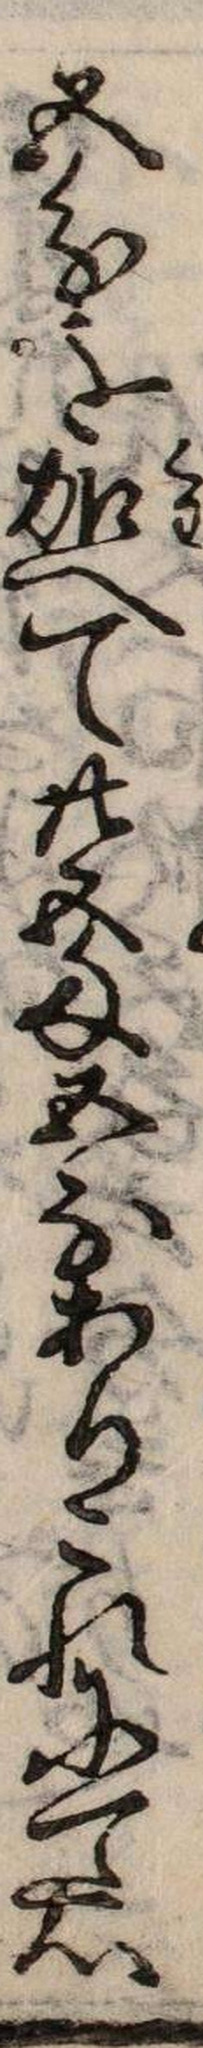五分を加へて廿五匁五分ありこれにて右
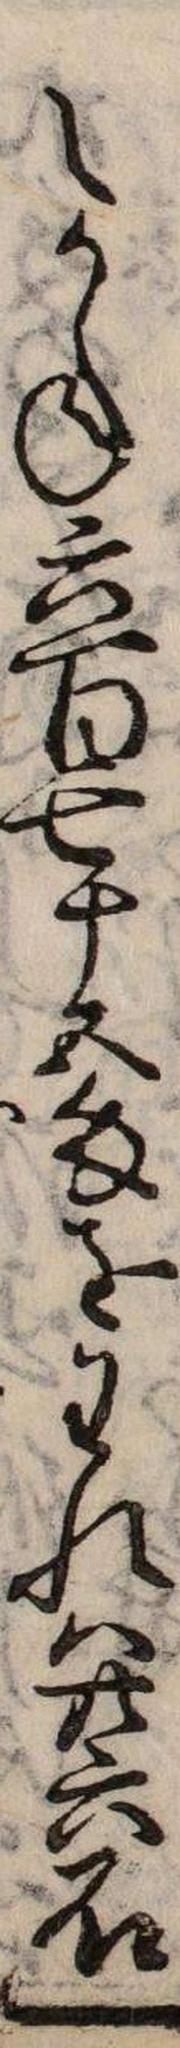のかね六百七十五匁をわれは廿六石
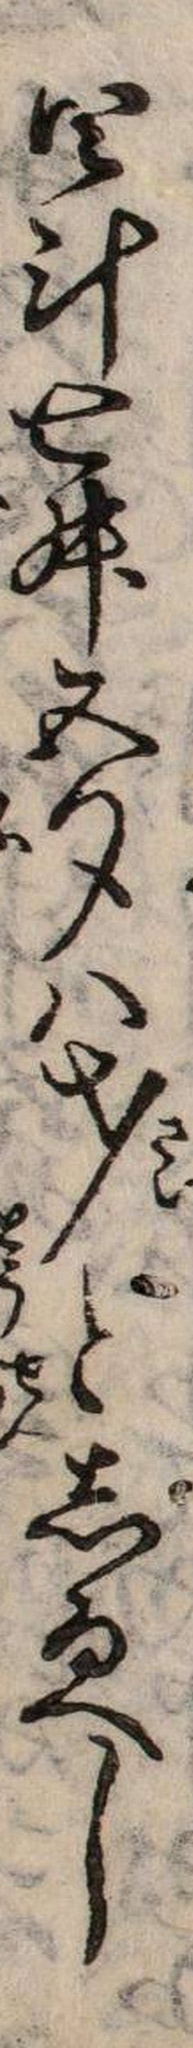四斗七舛五勺八才としるへし

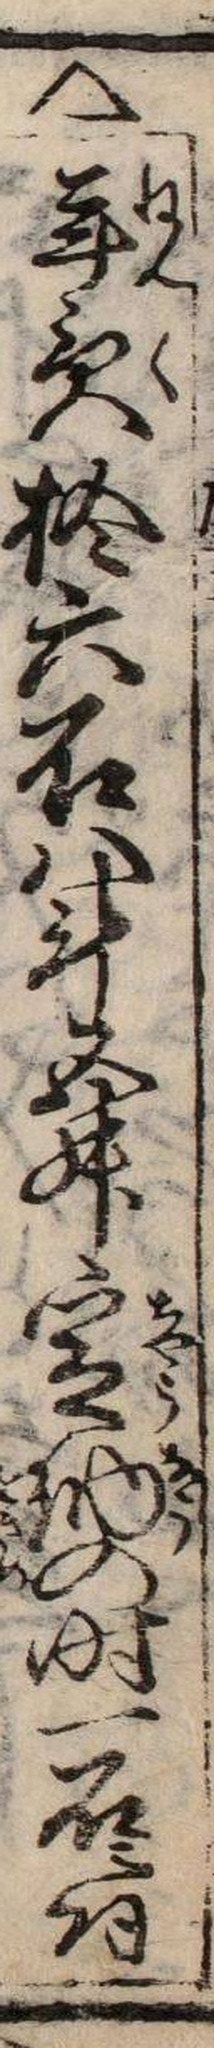△年貢拾六石八斗五升定納の時一石に付
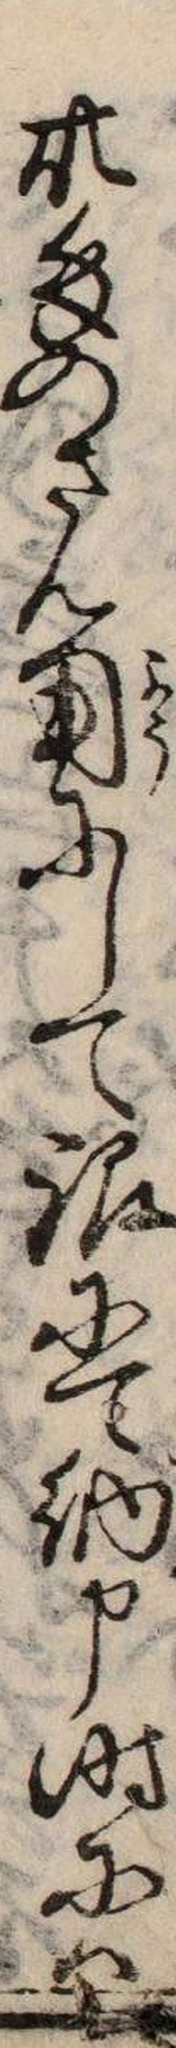卅匁のさん用にして銀にて納申時には
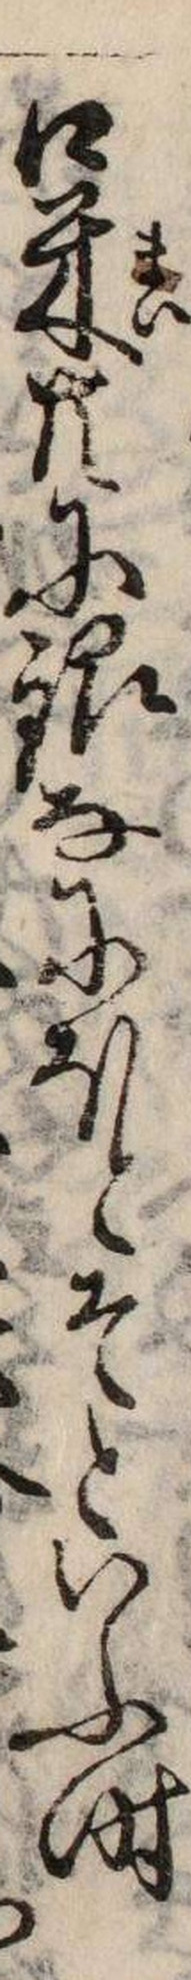口米共に銀なにほとそといふ時
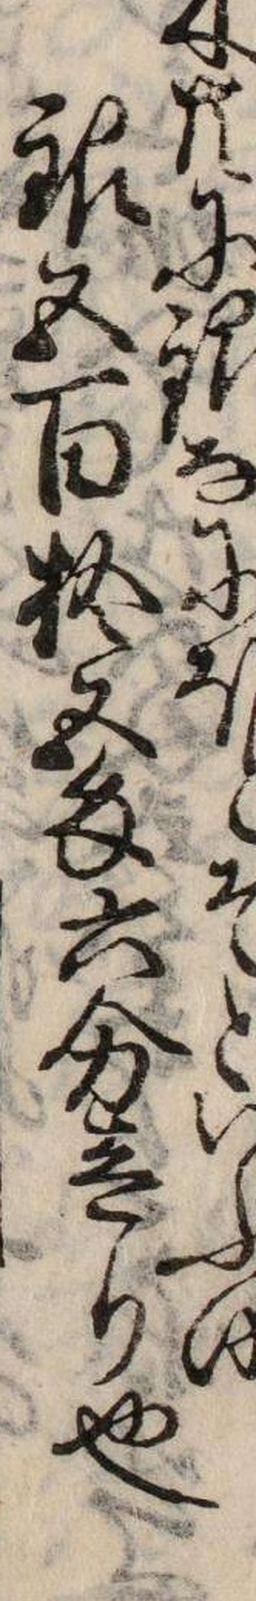銀五百拾五匁六分壱り也
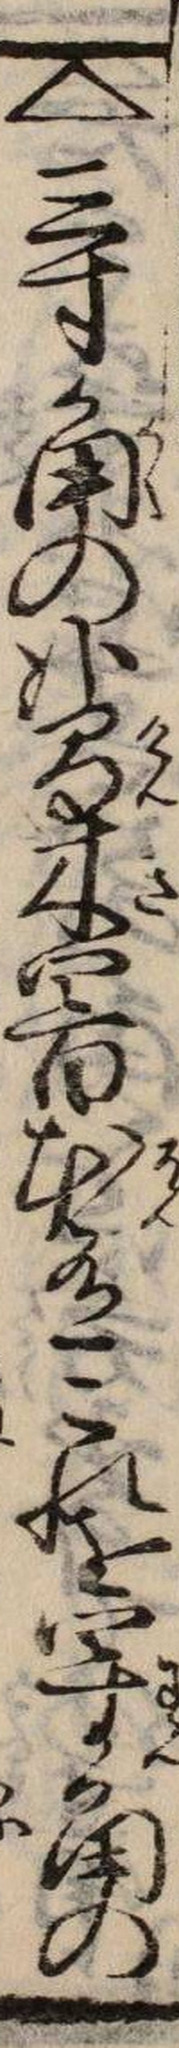△三寸角の弐間木四百本有これを四寸角の
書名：塵劫記（寛永11年自跋、京都府立京都学・歴彩館追貴8）
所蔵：京都府立京都学・歴彩館 国文学研究資料館
